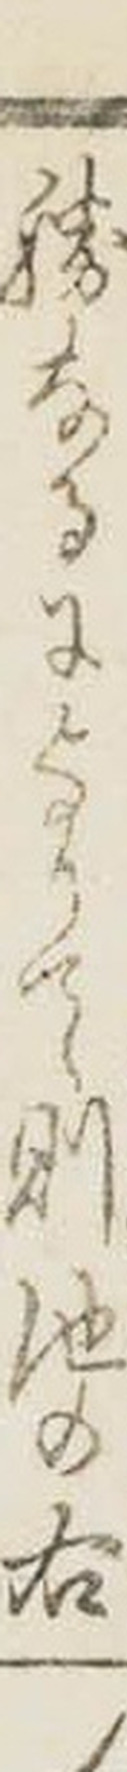勝なるによりて則池の右
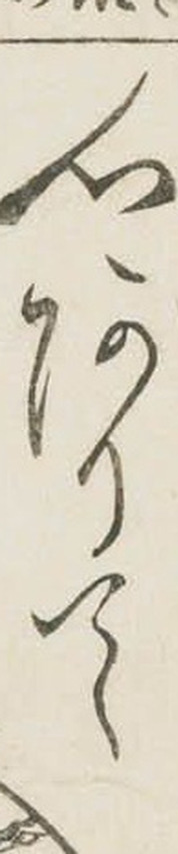心ありて
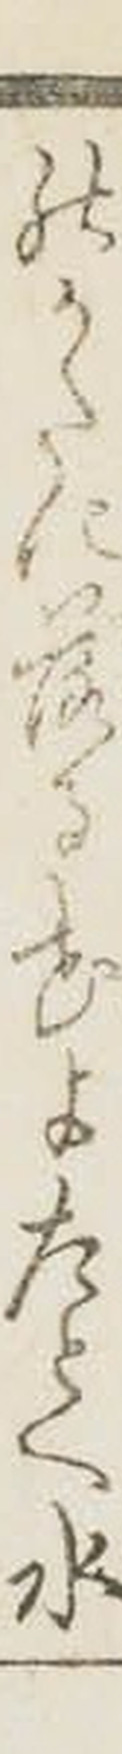のかたに落る花よたとへ水
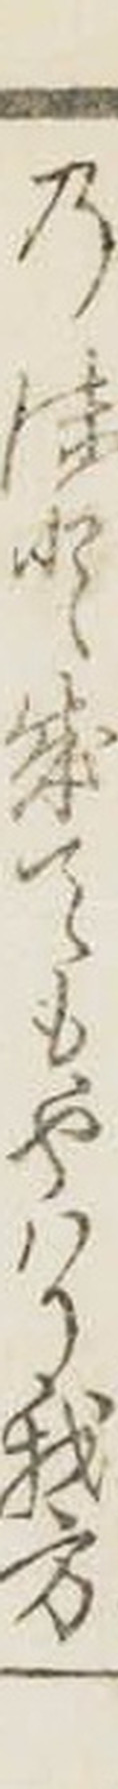の沫と成てもやはり我方
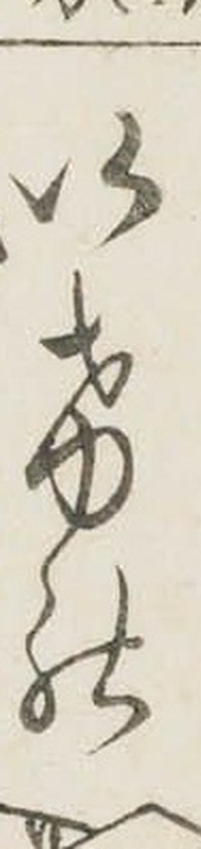いけの
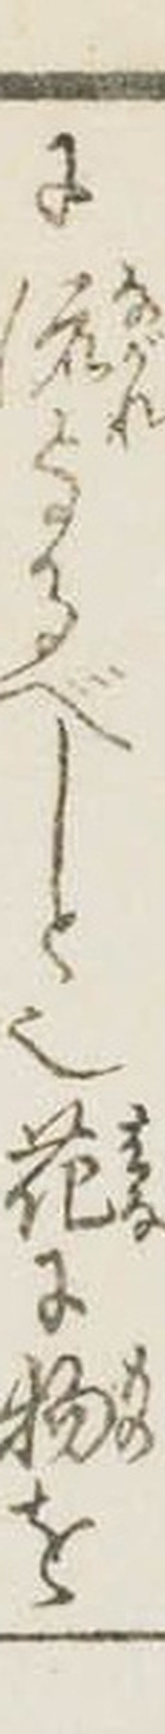に流よるべしと也花に物を
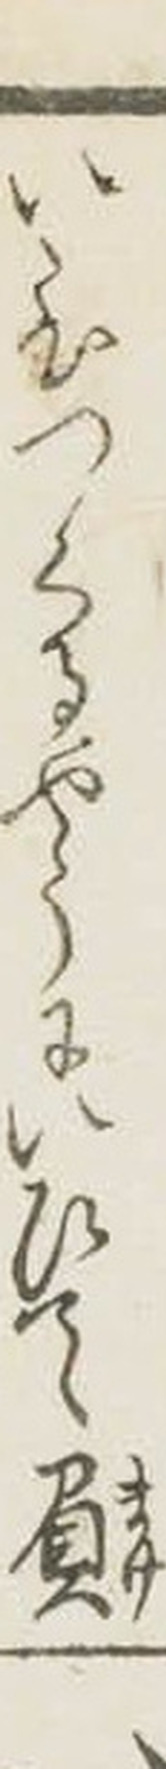いひつくるやうにいひて負
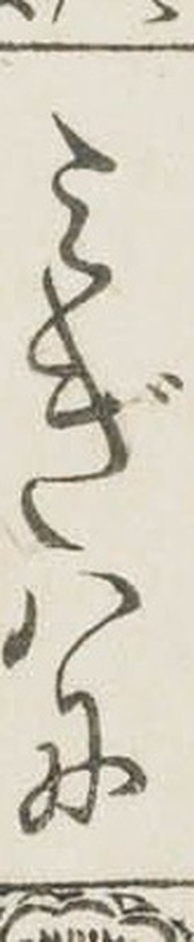みぎはに
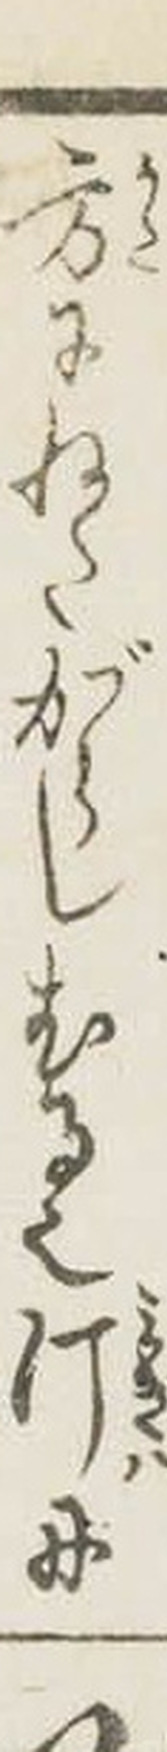方にねたがらしむる也汀に
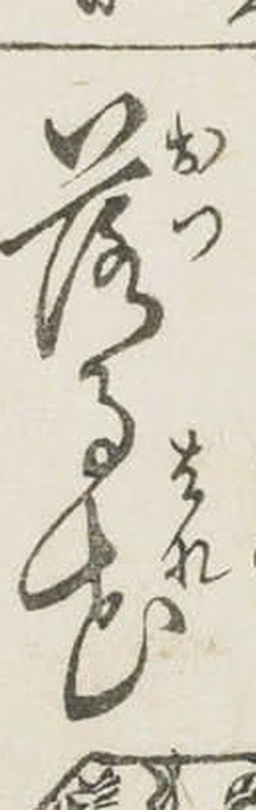落る花
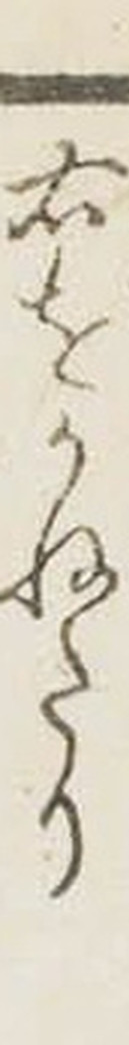右をかねたり
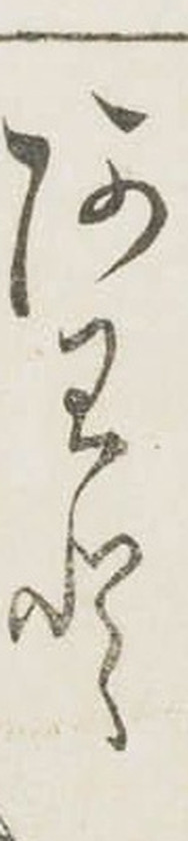あわと
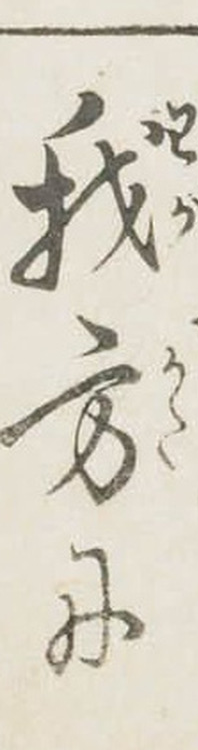我方に
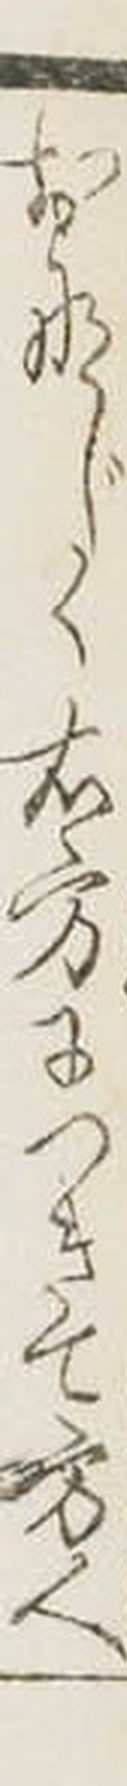おなじく右方につきて方人
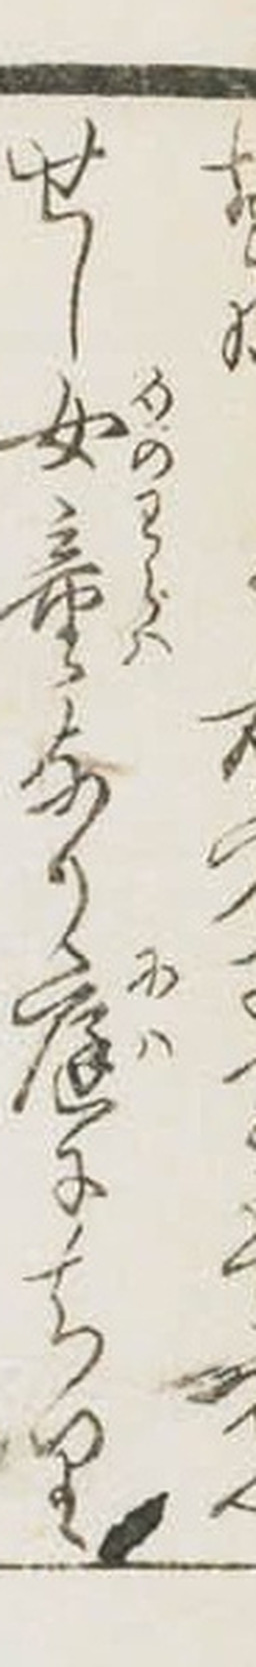せし女童なり庭にちり
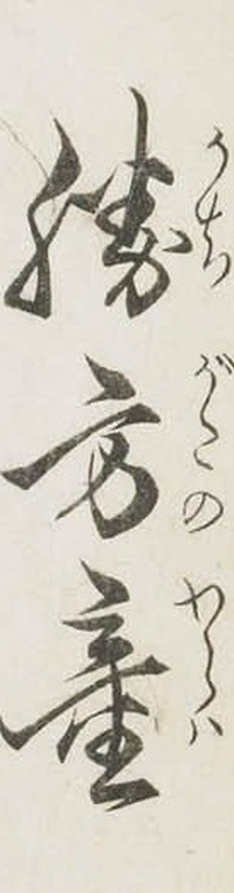勝方童
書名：源氏百人一首
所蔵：東京学芸大学教育コンテンツアーカイブ
